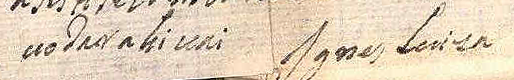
uo dar ahi uai Jgnes Luiza
